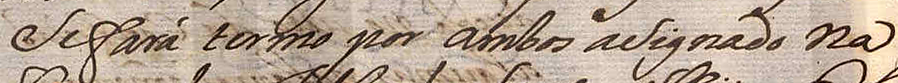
Se fará termo por ambos asignado na
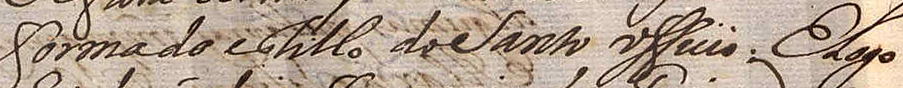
forma do estillo do Santo officio. E Logo
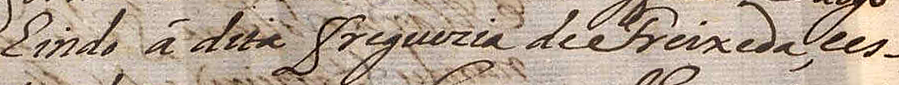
hindo á dita freguezia de Freixeda, e es
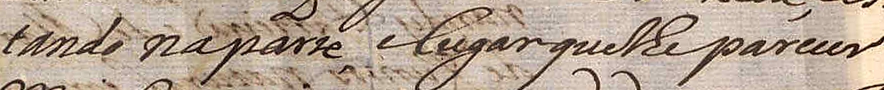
tando na parte e lugar que lhe parecer
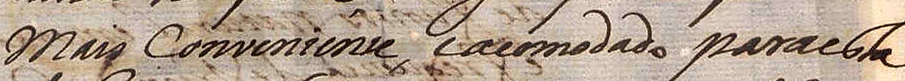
mais conveniente, e acomodado para esta
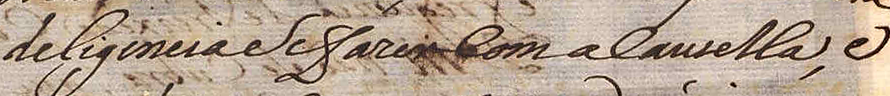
deligencia Se fazer Com a Cautella, e
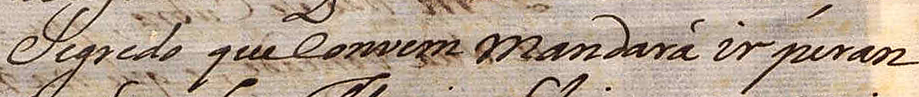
Segredo que convem mandará ir peran
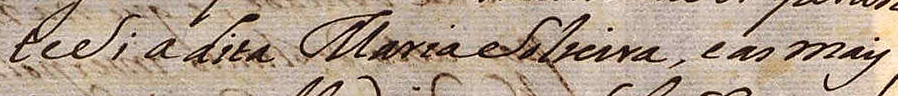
te Si a dita Maria Solteira, e as mais
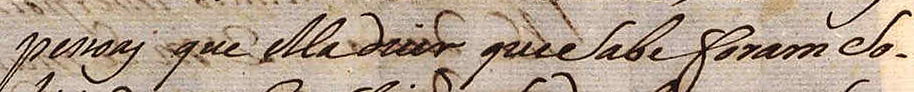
pessoas que ella dicer que Sabe foram So
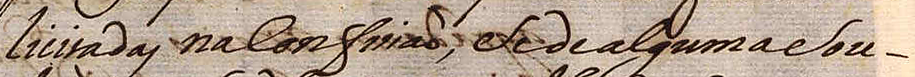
licitadas na Confissaõ, Se de alguma Sou
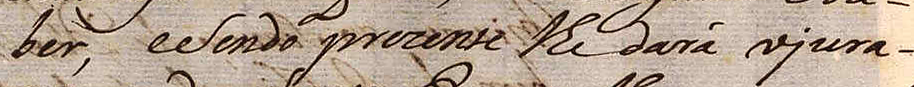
ber, e Sendo prezente lhe dará o jura
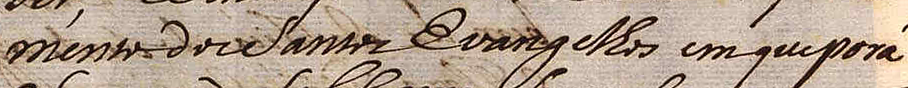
mento dos Santos Evangelhos em que porá
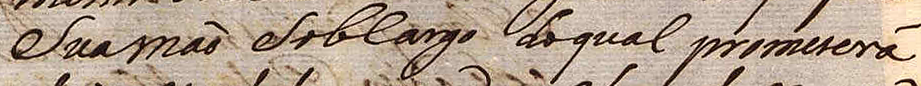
Sua maõ Sob cargo do qual prometerá
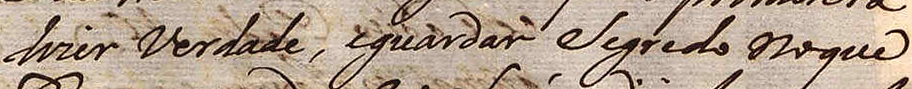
dizer verdade, e guardar Segredo no que
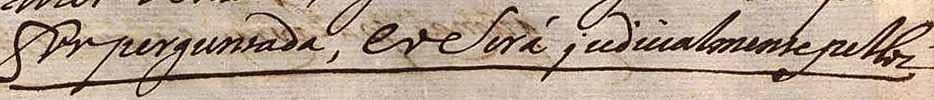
for perguntada, e o Será judicialmente pellos
